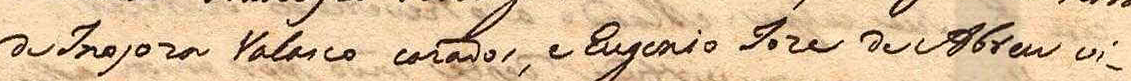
de Inojoza Valasco cazados, e Eugenio Ioze de Abreu vi
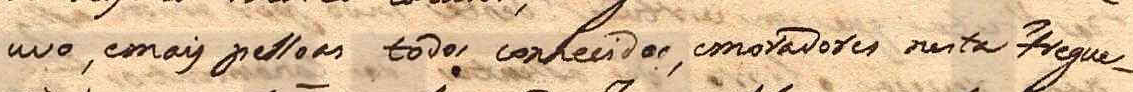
uvo, e mais pessoas todos conhecidos, e moradores nesta Fregue
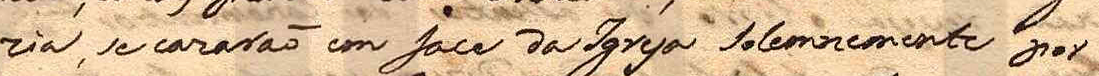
zia se cazarão em face da Igreja, solemnemente por
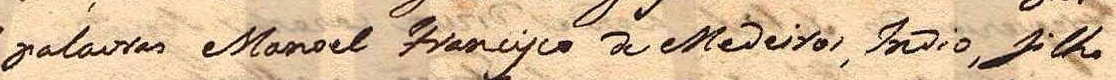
palavras Manoel Francisco de Medeiros, Indio, filho
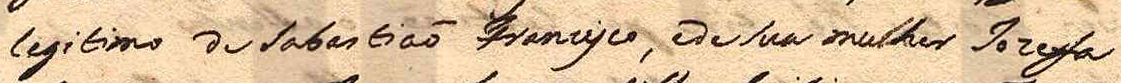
legitimo de sabastiaõ Francisco, e de sua mulher Iozefa
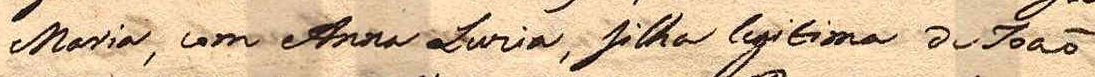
Maria, com Anna Luzia, filha legitima de Ioaõ
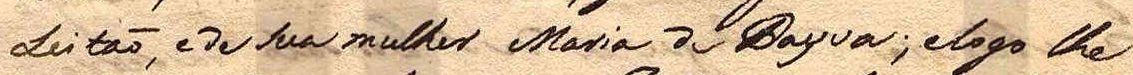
Leitaõ, e de sua mulher Maria de Payva; e logo lhe
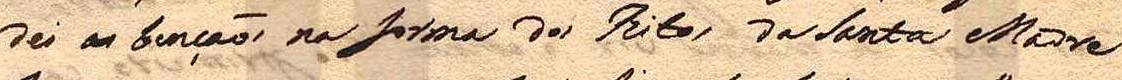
deI as bençaõs na forma dos Ritos da Santa Madre
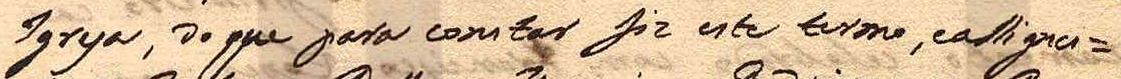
Igreja, do que para constar fiz este termo, e assignei=
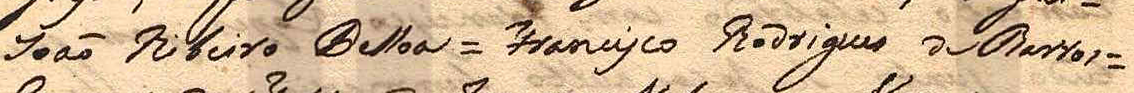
Joao RIbeiro Pessoa = Francisco Rodrigues de Barros=
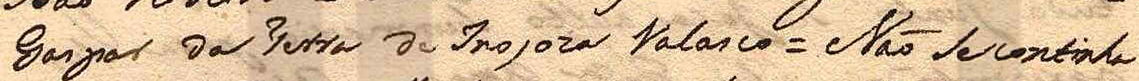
Gaspar da Terra de Inojoza Valasco = Naõ se continha
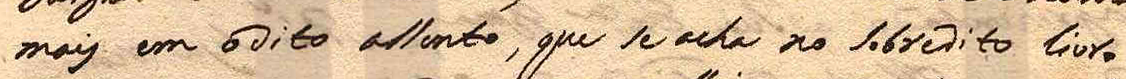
mais em o dito assento, que se acha no sobredito livro
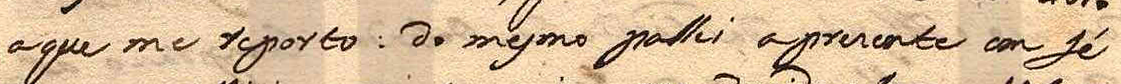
a que me reporto: do mesmo passei a prezente em fé
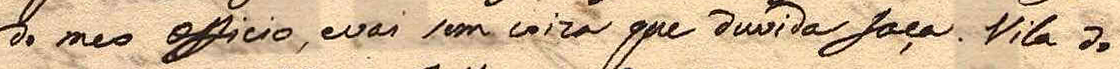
do meo officio, e vai sem coiza que duvida faça. Vila do
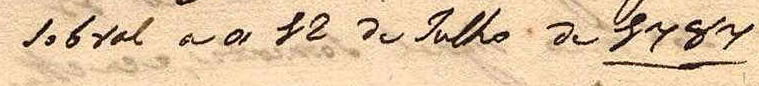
sobral aos 12 de Iulho de 1787
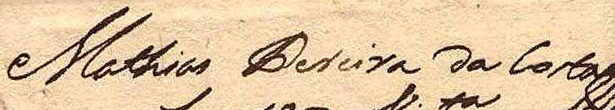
Mathias Pereira da Costa
